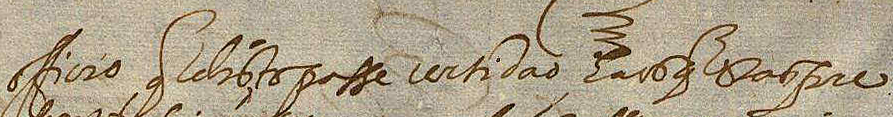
officio q̄ disto passe certidão, E aos q̄ estaõ pre
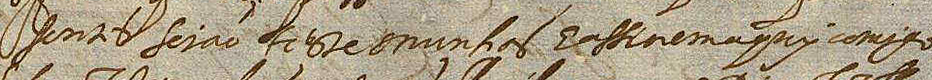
sentes seiaõ testemunhas E assinem aquy comigo
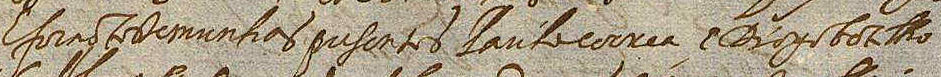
E foraõ testemunhas presentes Paulo correa, e Diogo botelho
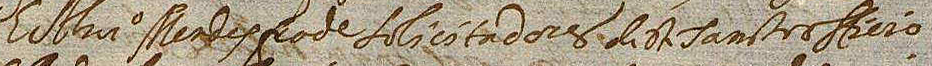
E Aluro Mendes frade solicitadores desto sancto officio
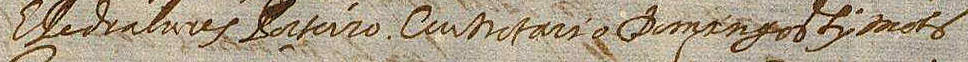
E Pedralures Porteiro. E eu notario Domingos symois
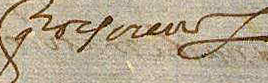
q̄ o escrevy
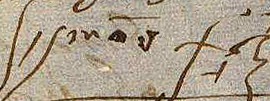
Sijmão frz
